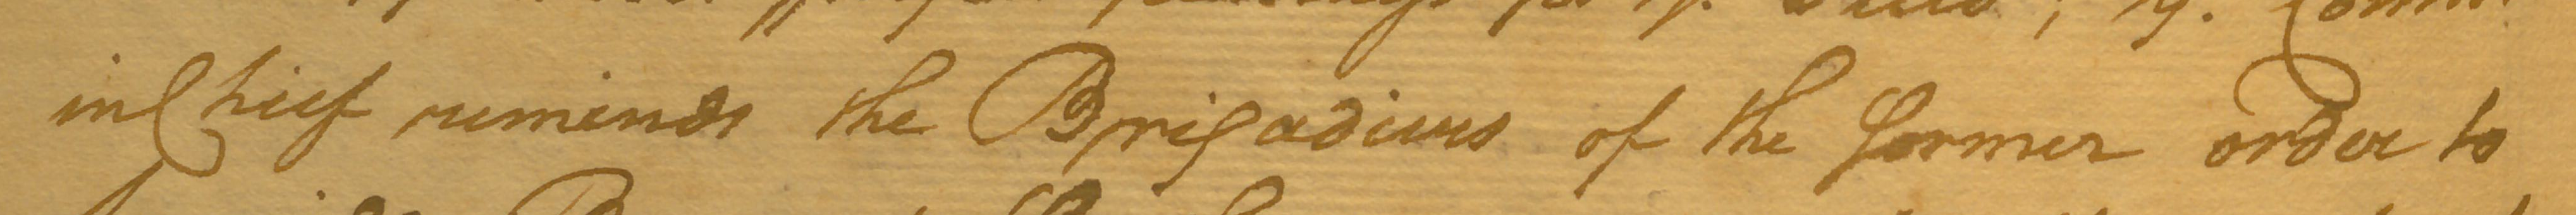in Chief reminds the Brigadiers of the former order to
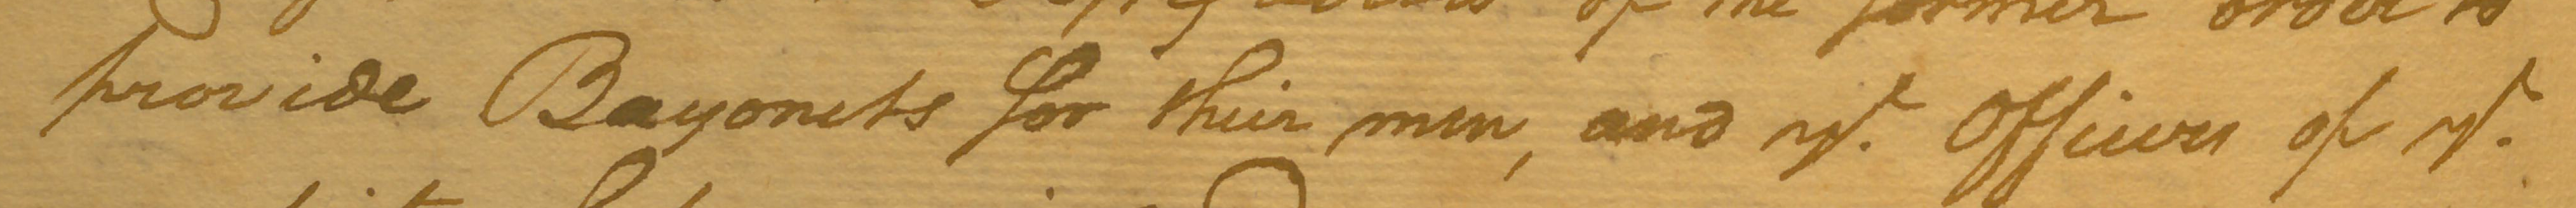provide Bayonets for their men, and y^e. Officers of y^e.
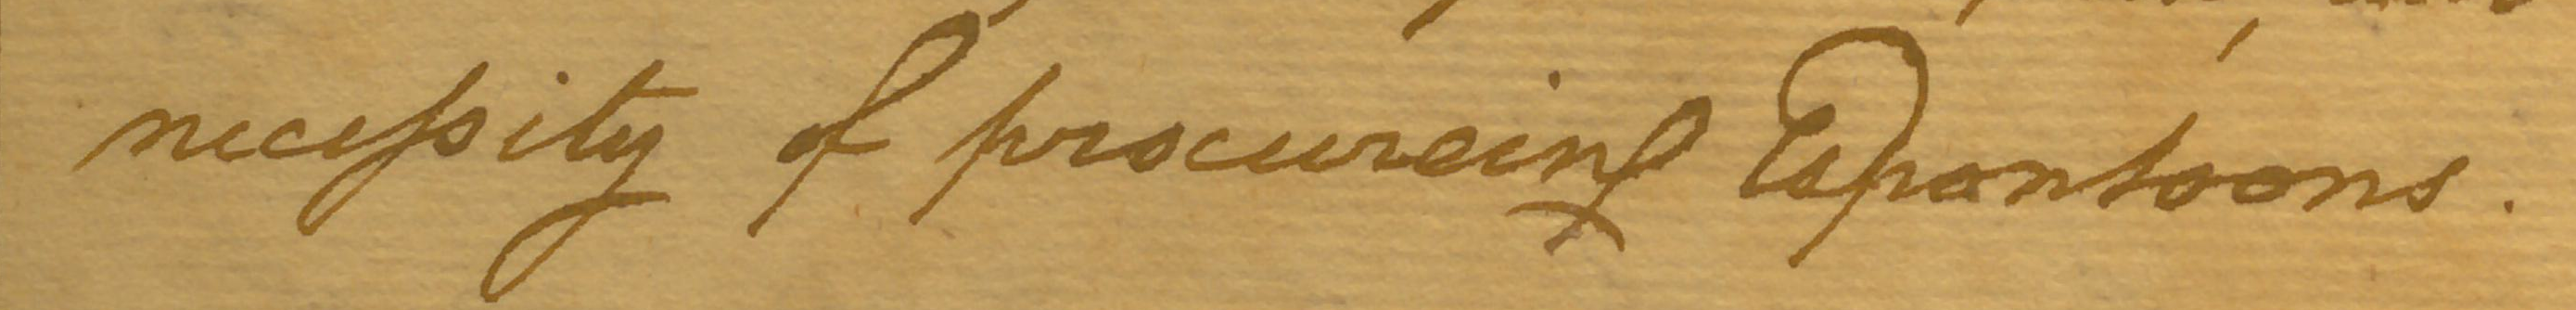necessity of procureing Espontoons.
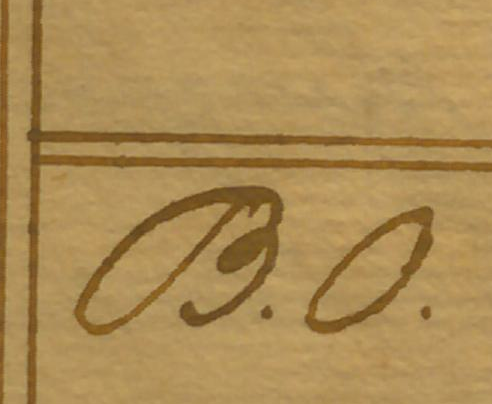B. O.
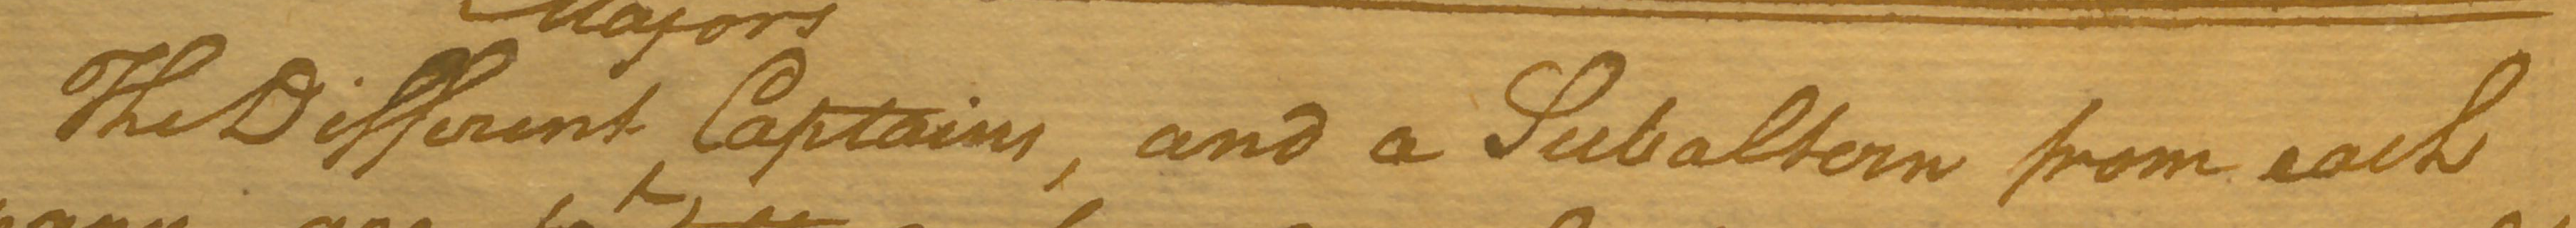The Different ^ Captains, and a Subaltern from each
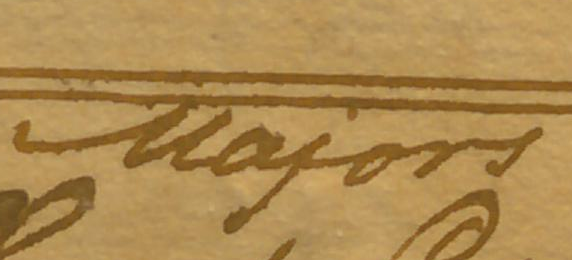Majors
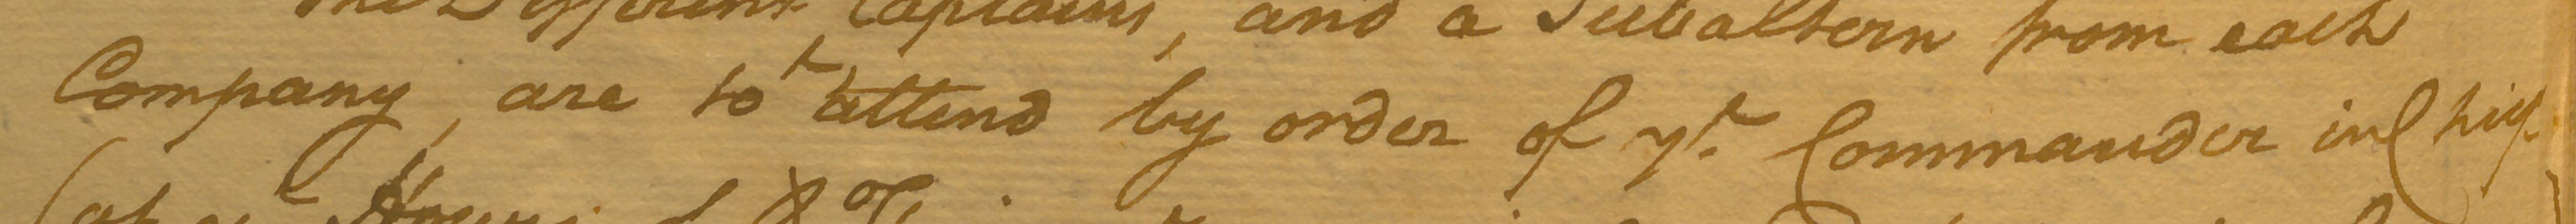Company, are to attend by order of y^e. Commander in Chief
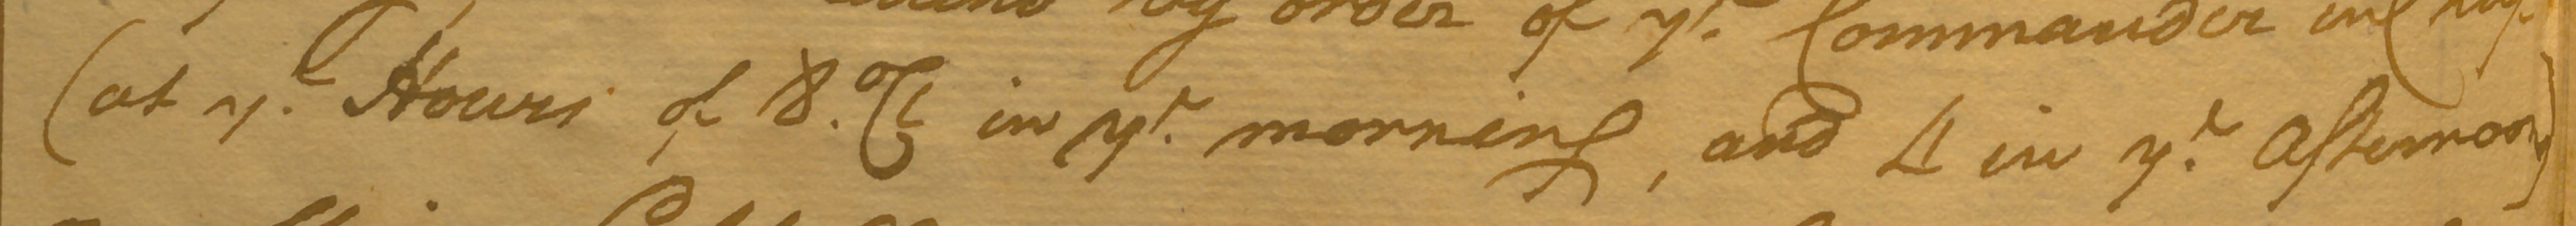(at y^e. Hours of 8 ^oCl. in y^e. morning, and 4 in y^e. afternoon)
